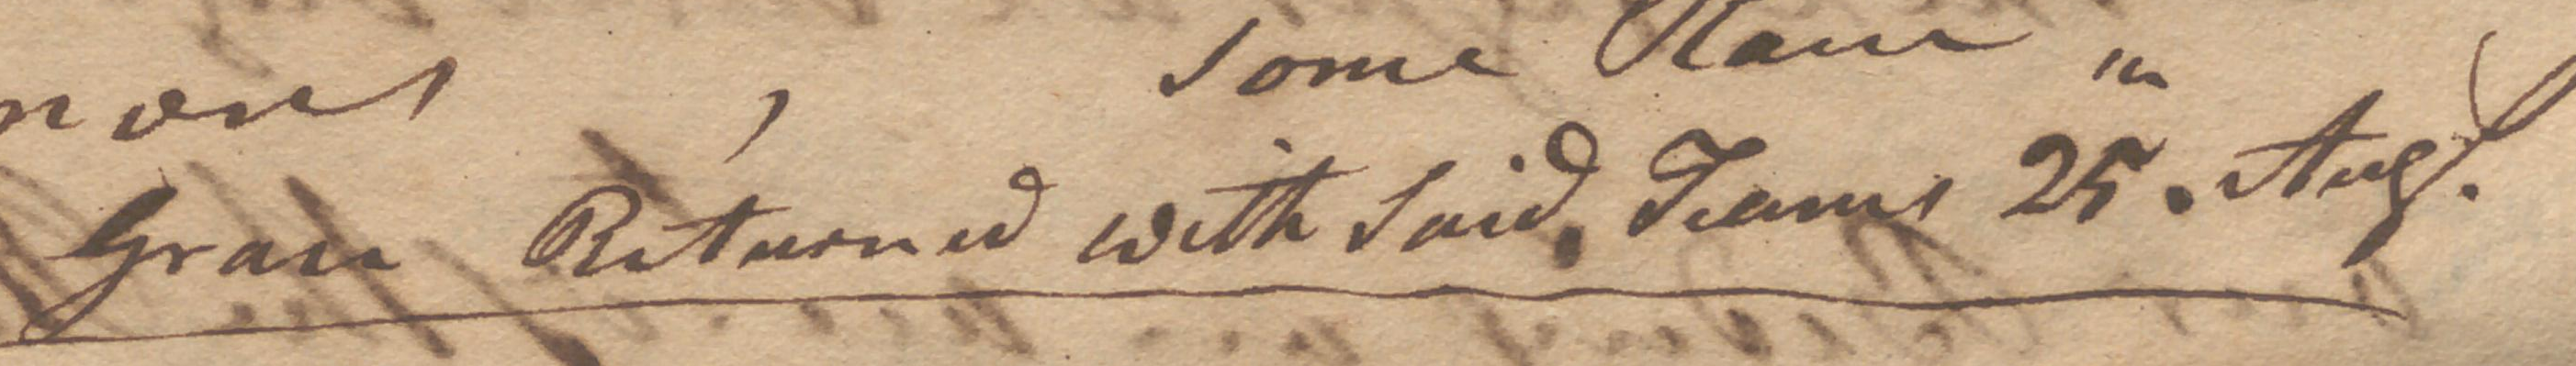Grau Returned with Said Teams 25. Aug^t.
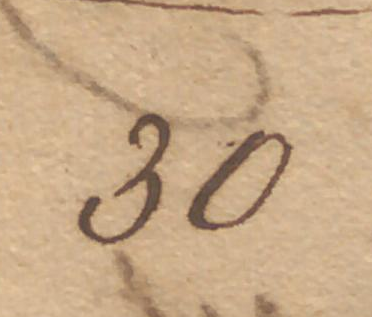30
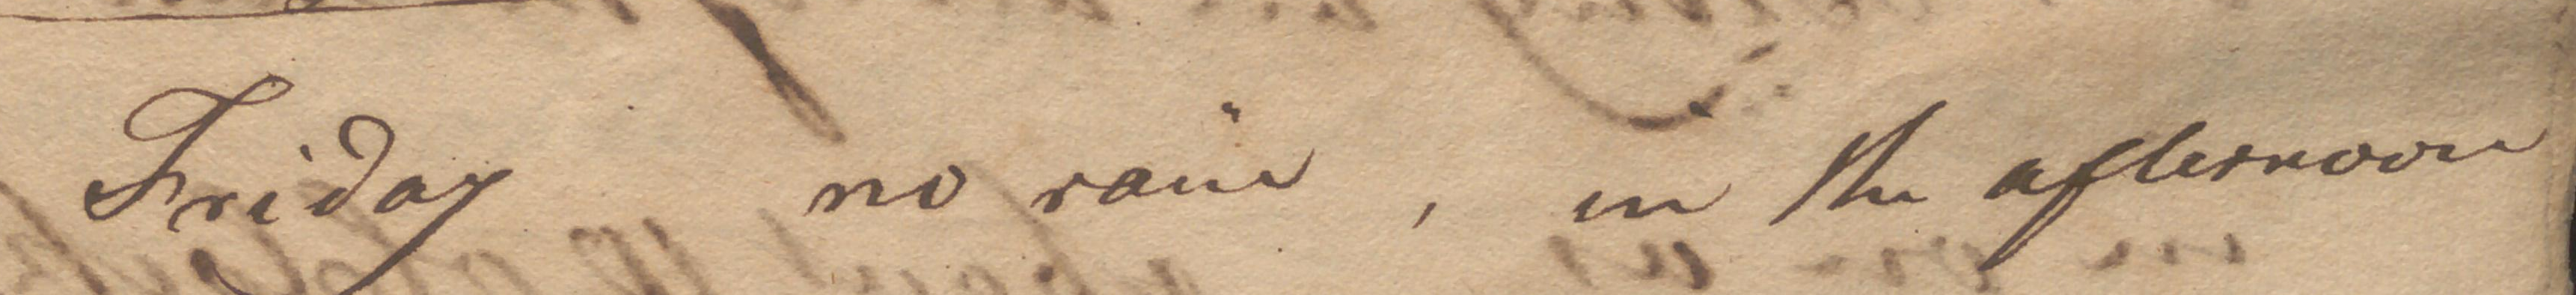Friday- no rain, in the afternoon
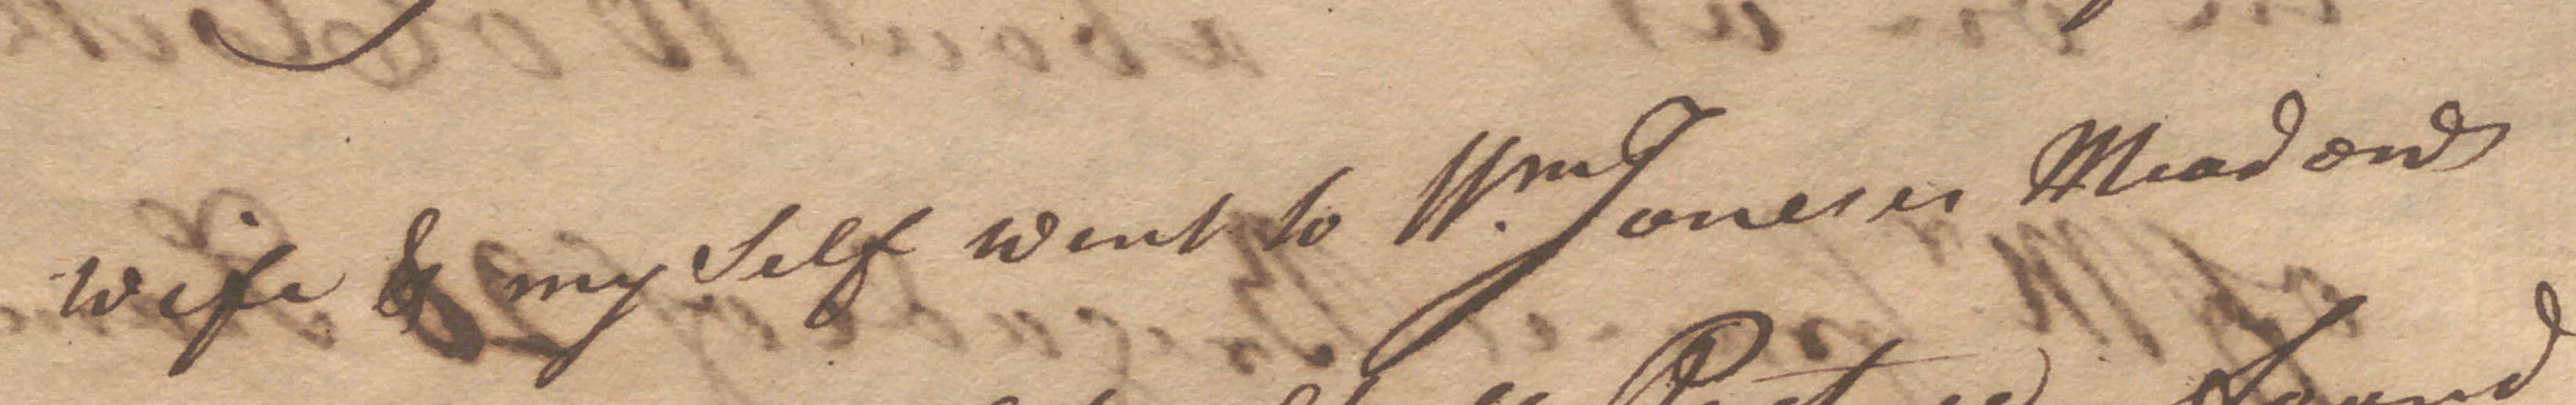wife & my self went to W^m. Joneses Meadows
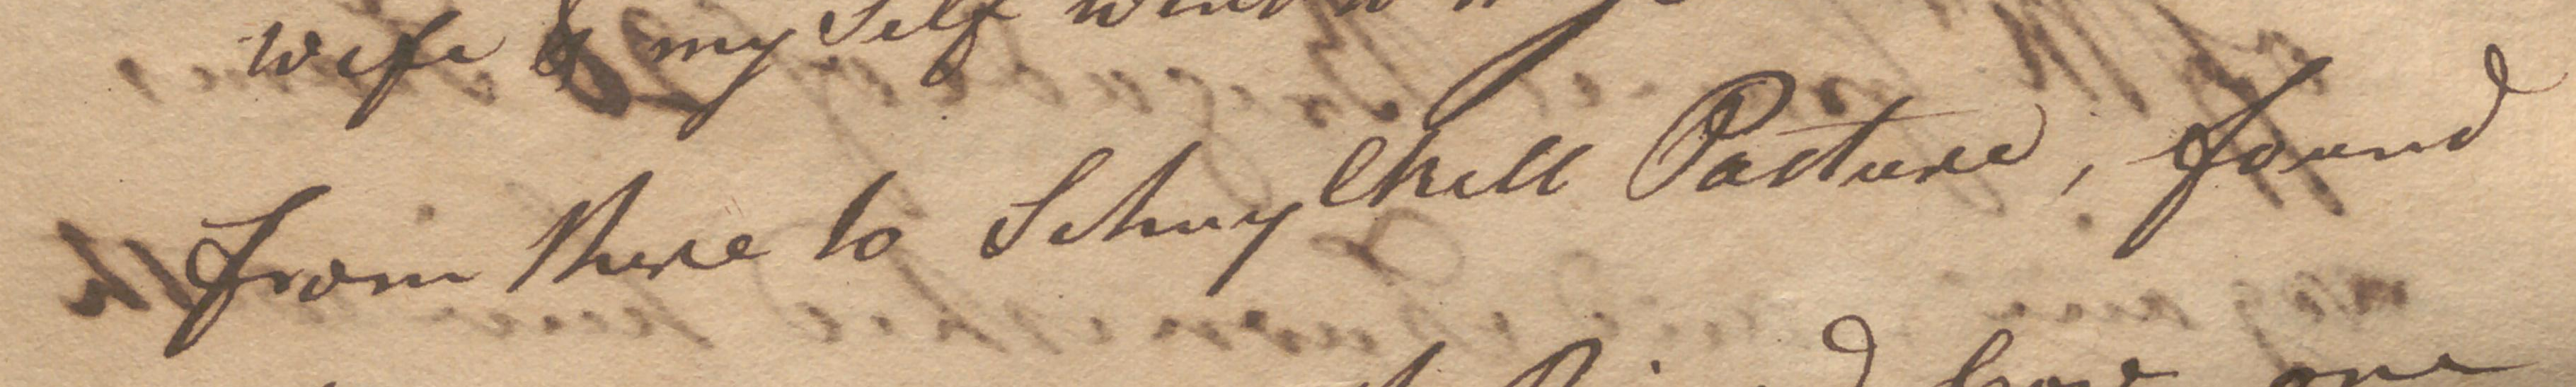from there to Schuylkill Pasture, found
